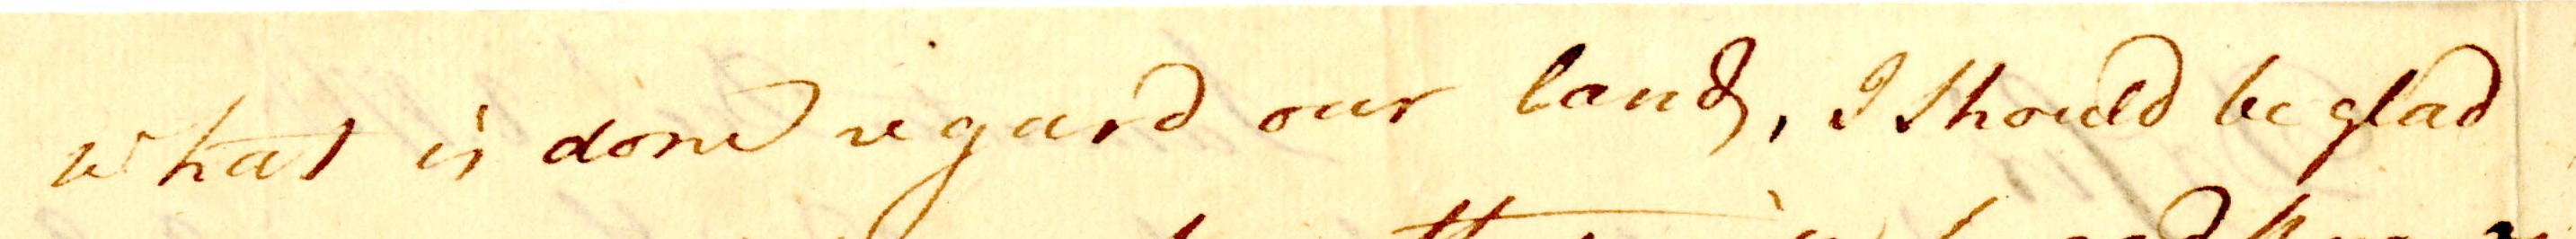what is done regard our land, I should be glad
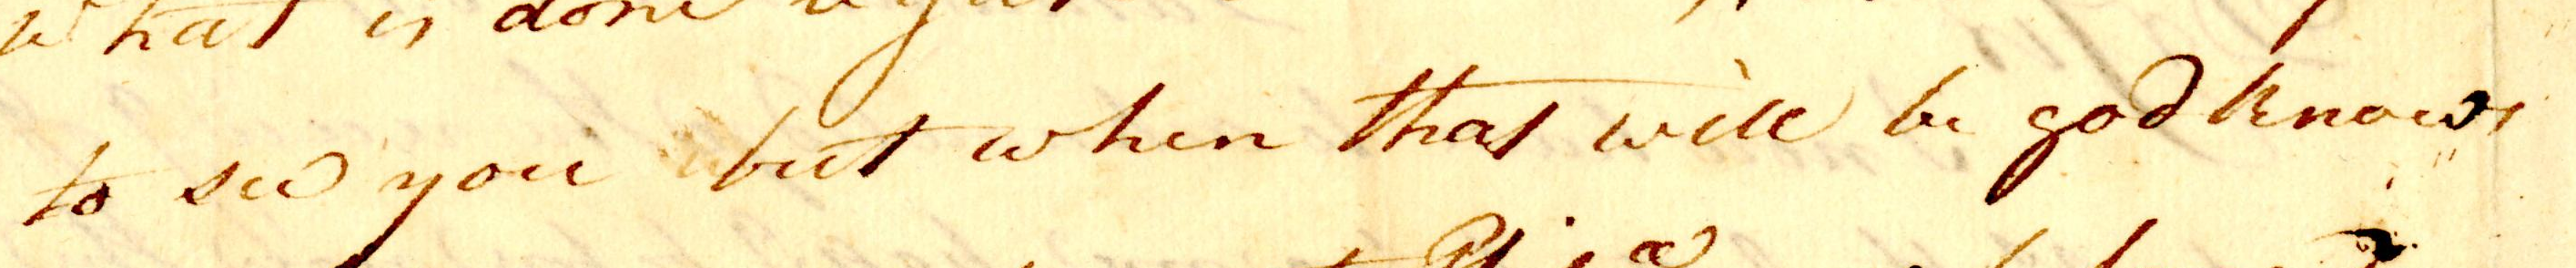to see you but when that will be god knows
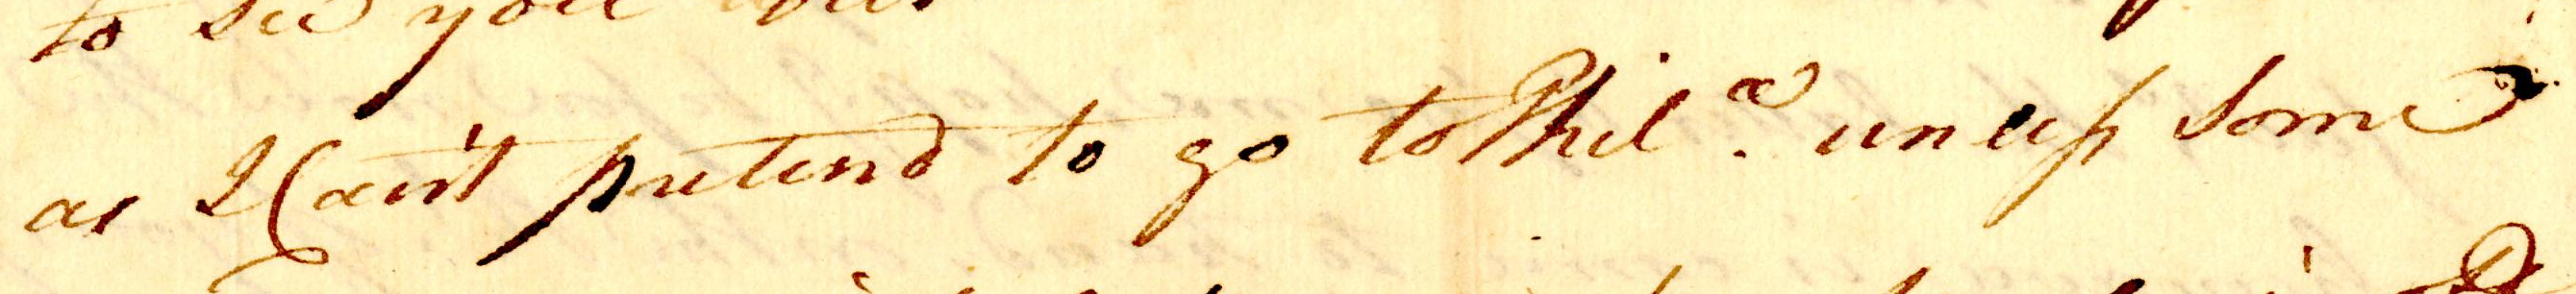as I Can't pretend to go to Phil^a. unless some
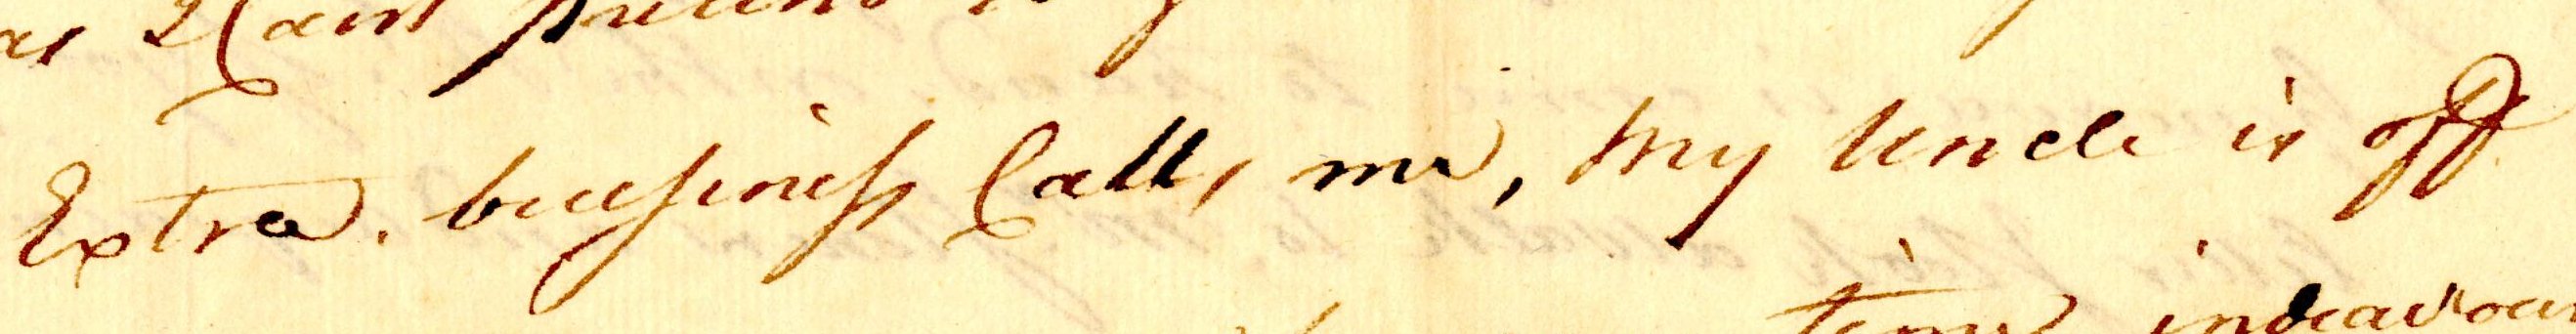Extra buiseness Calls me, my uncle is off
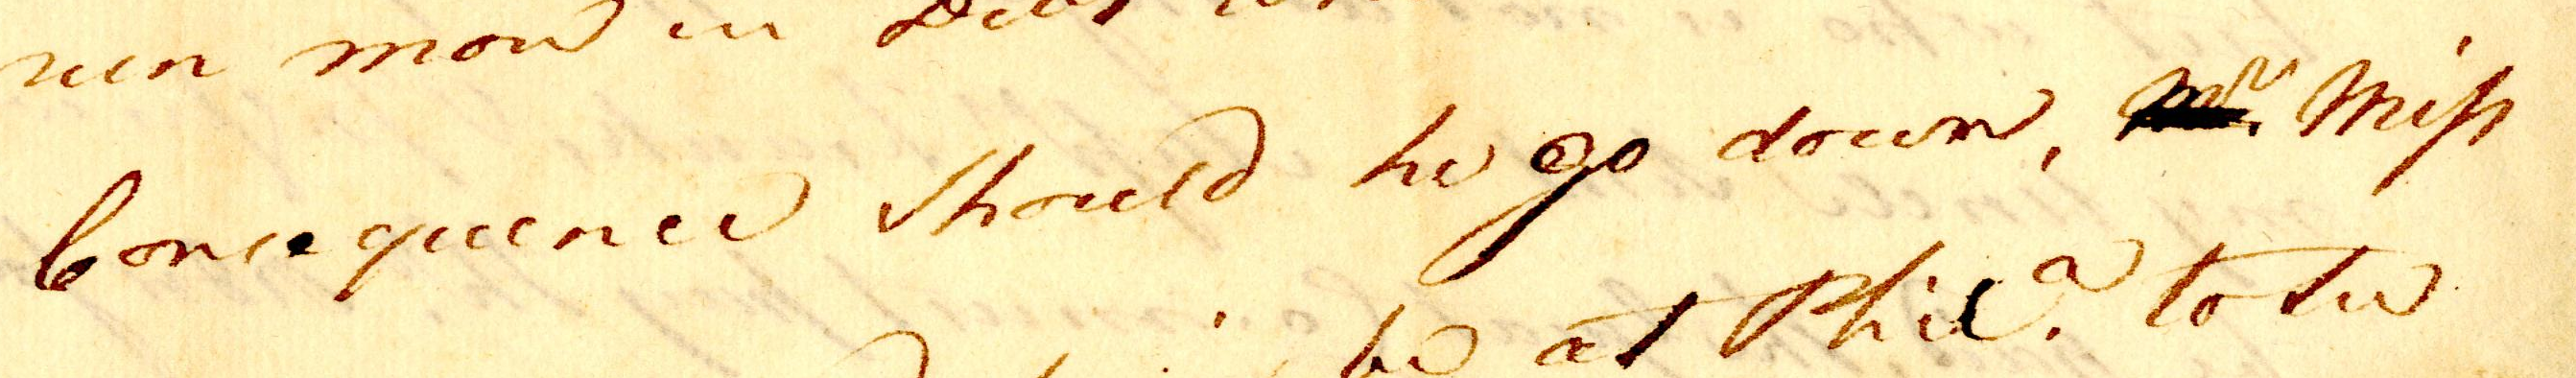Consequence should he go down, [M^r] Miss
